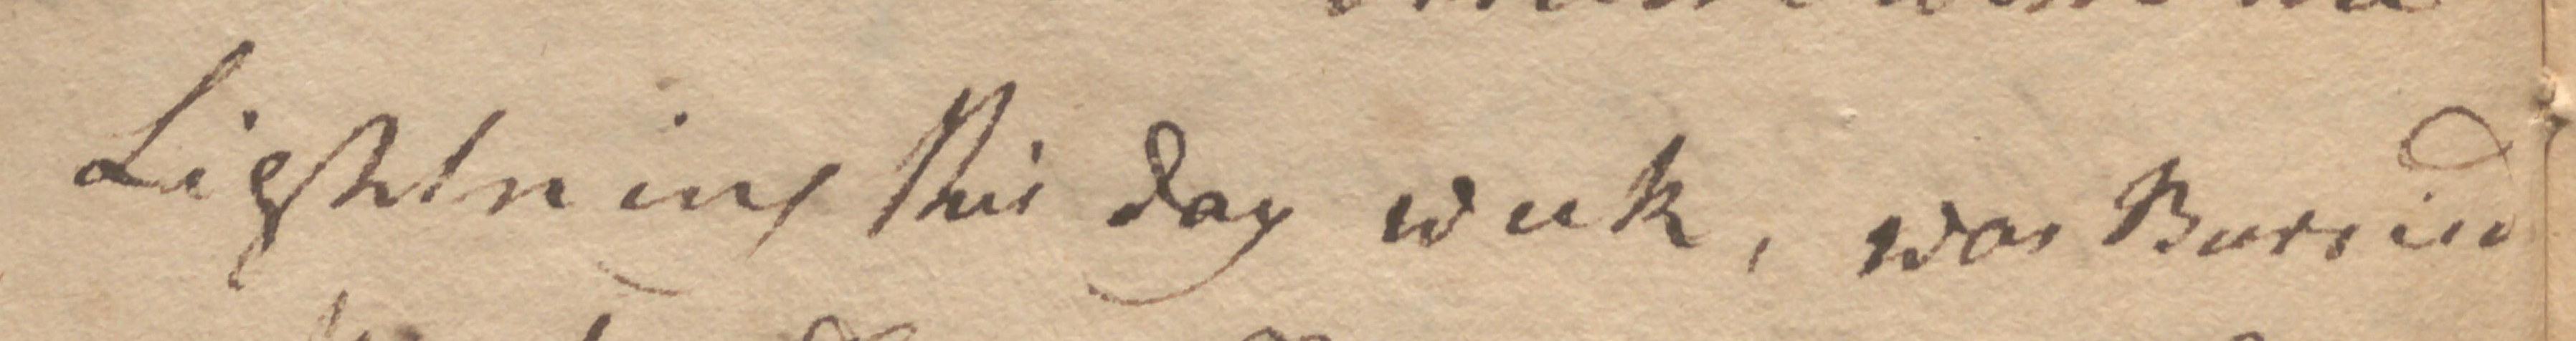Lightning this day week, was Burried
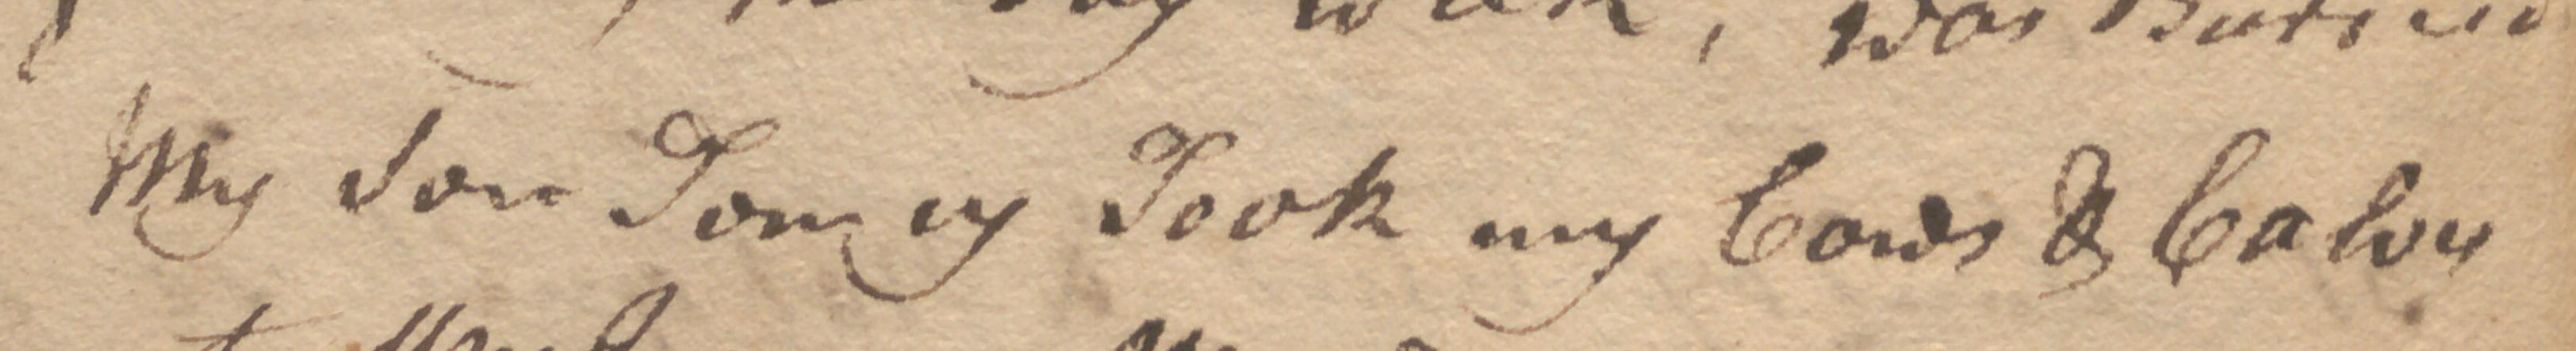My Son Tomey Took my Cows & Calves
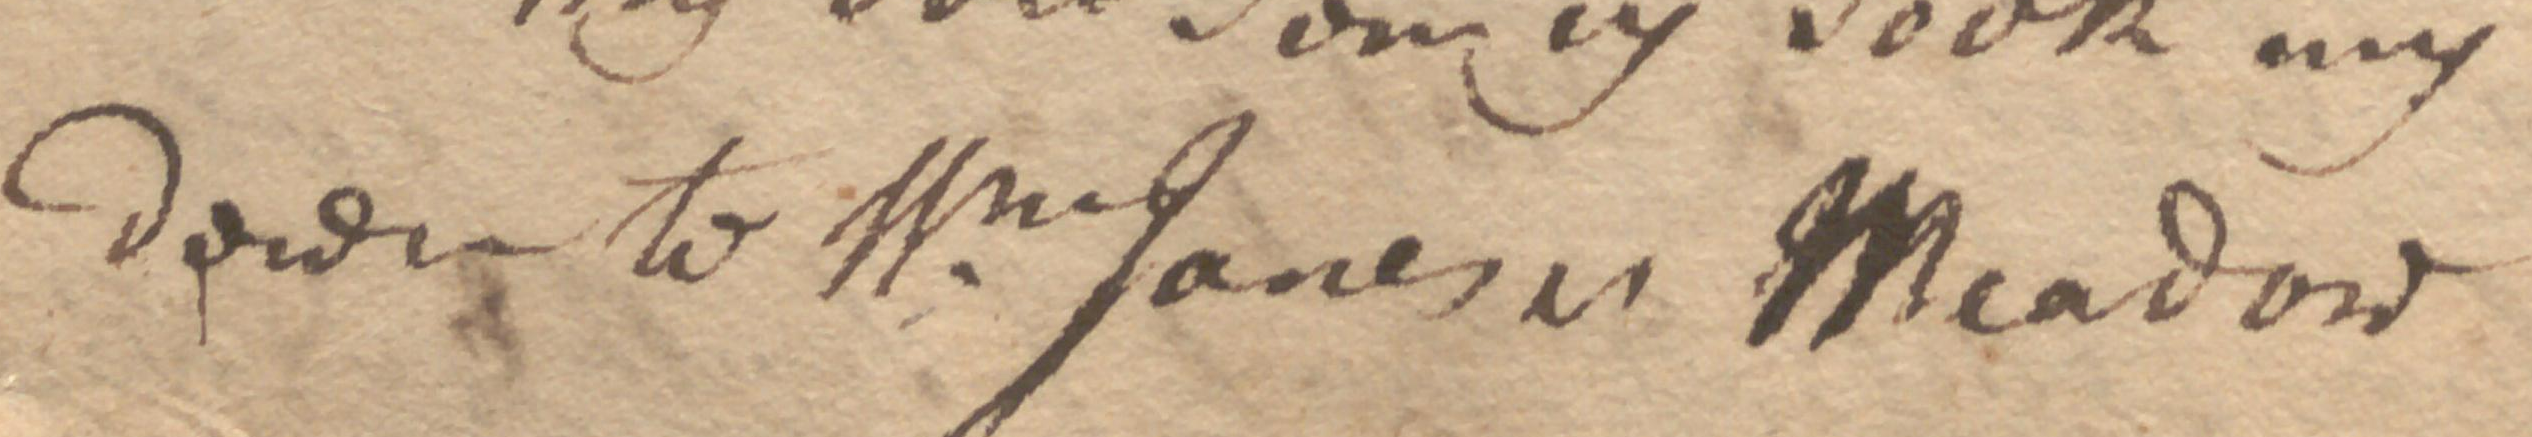down to W^m Janeses Meadow
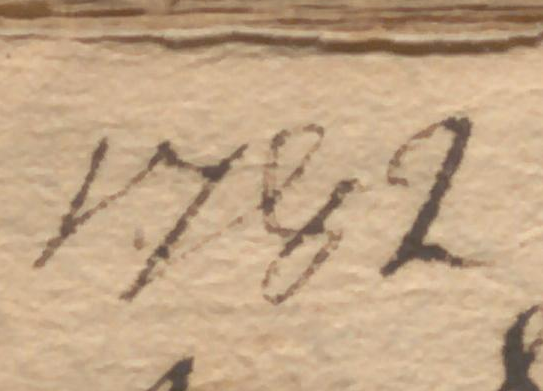1782
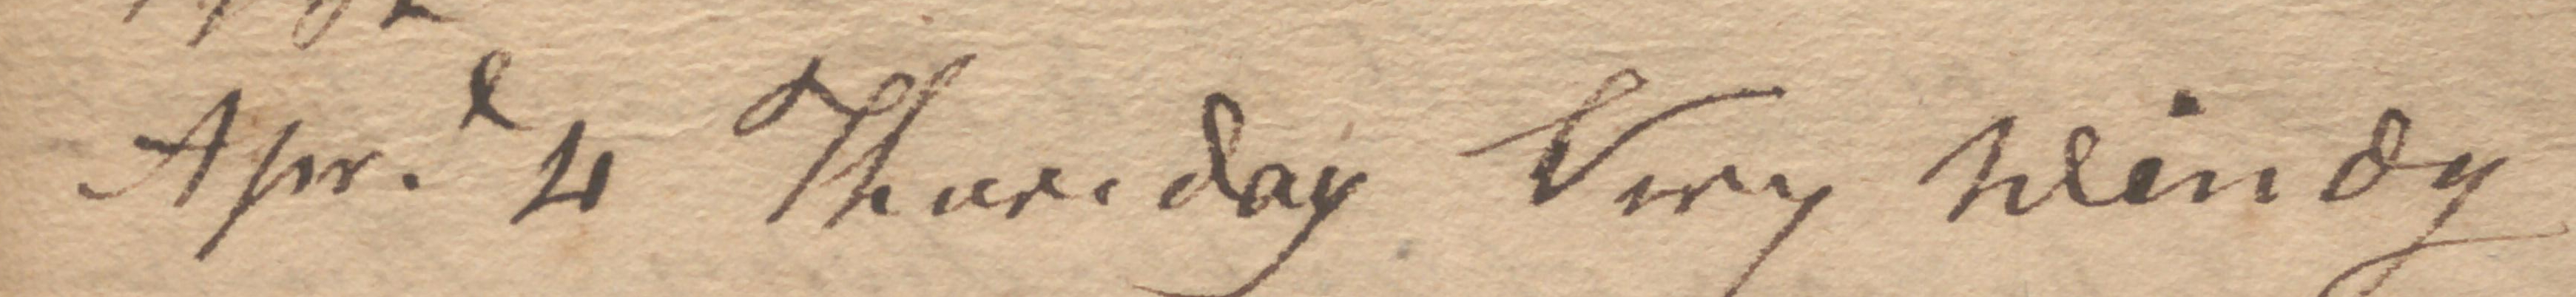Apr^l. 4 Thursday Very Windy
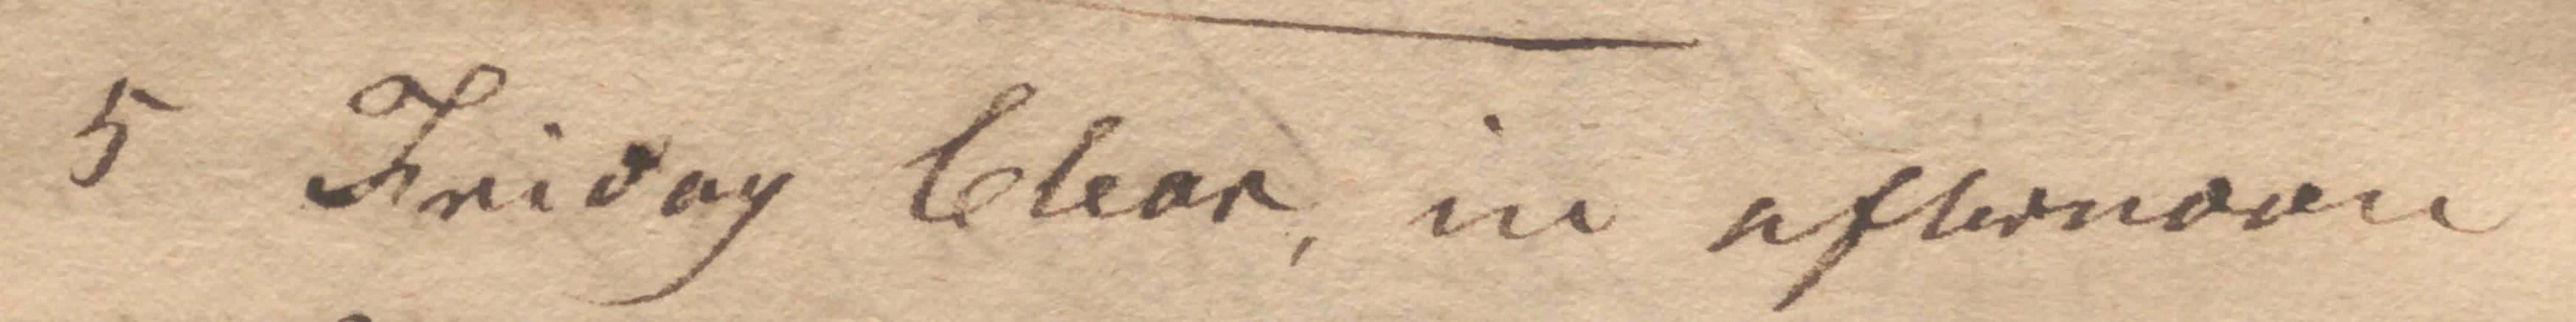5 Friday Clear in afternoon
